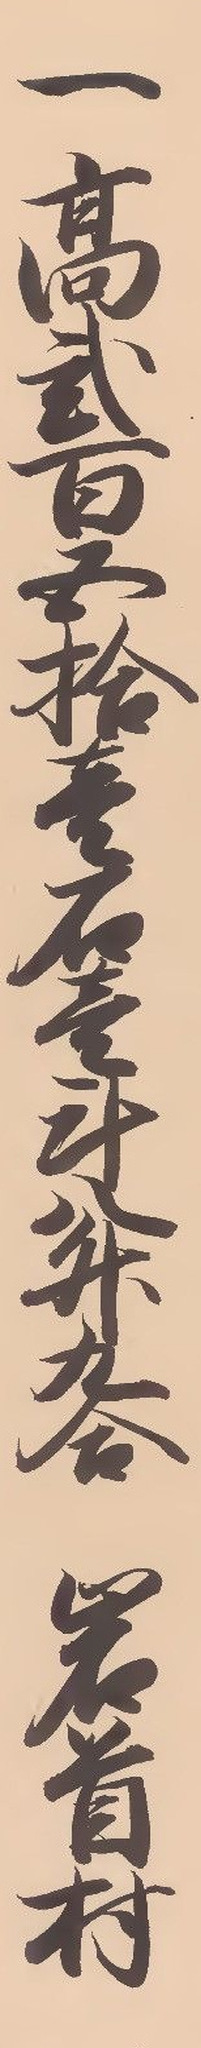一高弐百五拾壱石壱斗八升九合岩首村
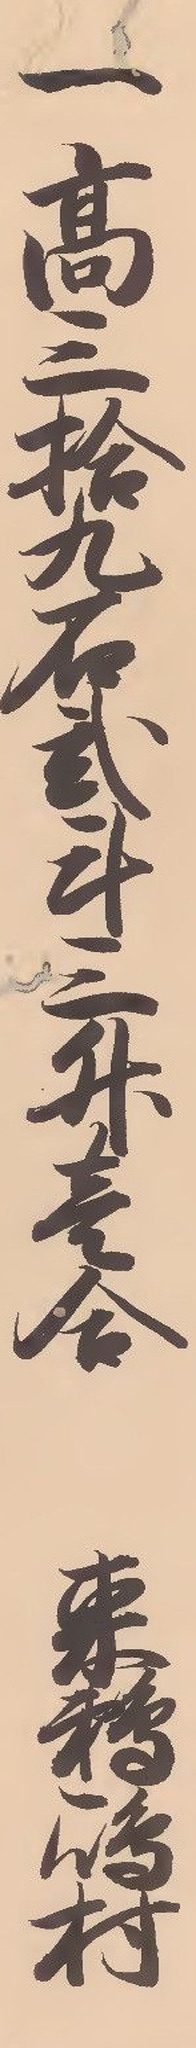一高三拾九石弐斗三升壱合東鵜崎村

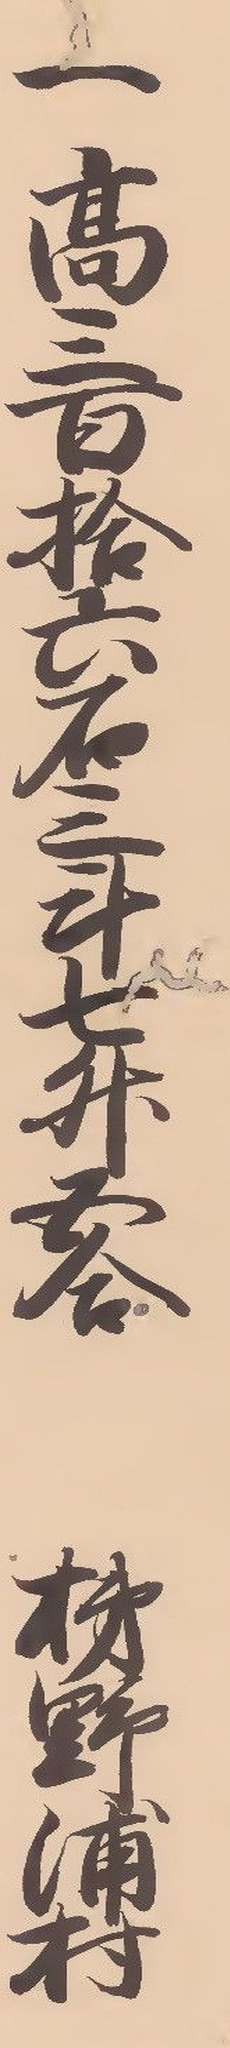一高三百拾六石三斗七升五合柿野浦村
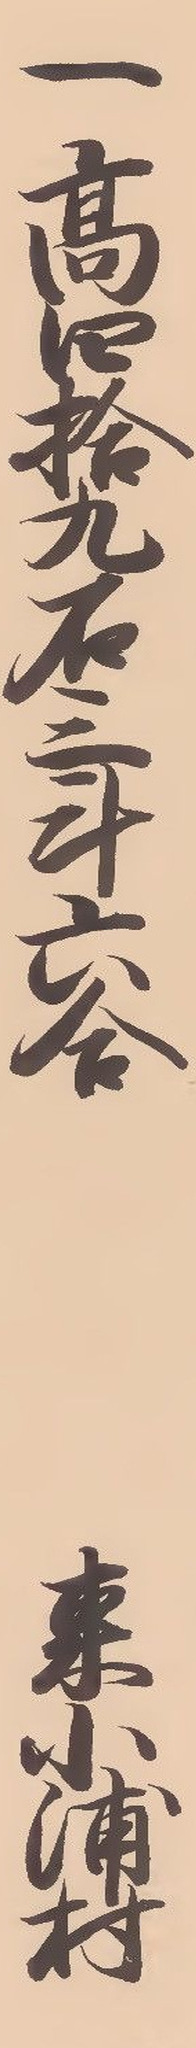一高四拾九石三斗六合東小浦村
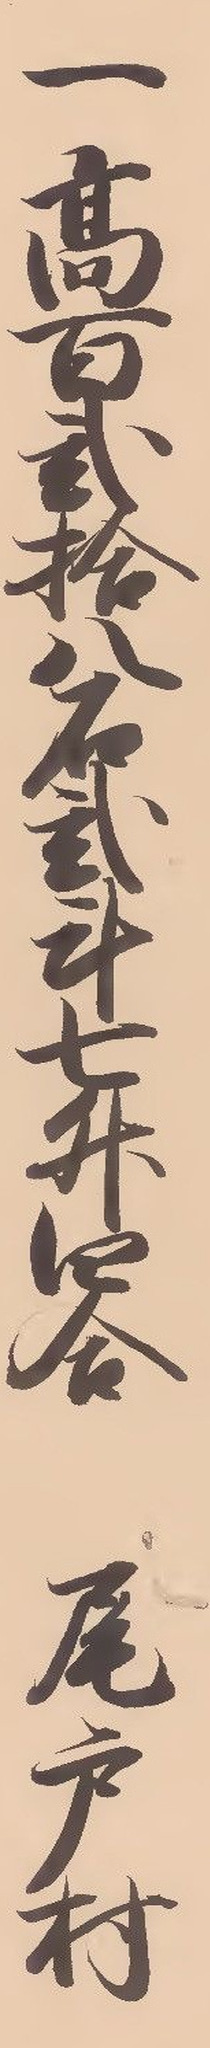一高百弐拾八石弐斗七升四合尾戸村
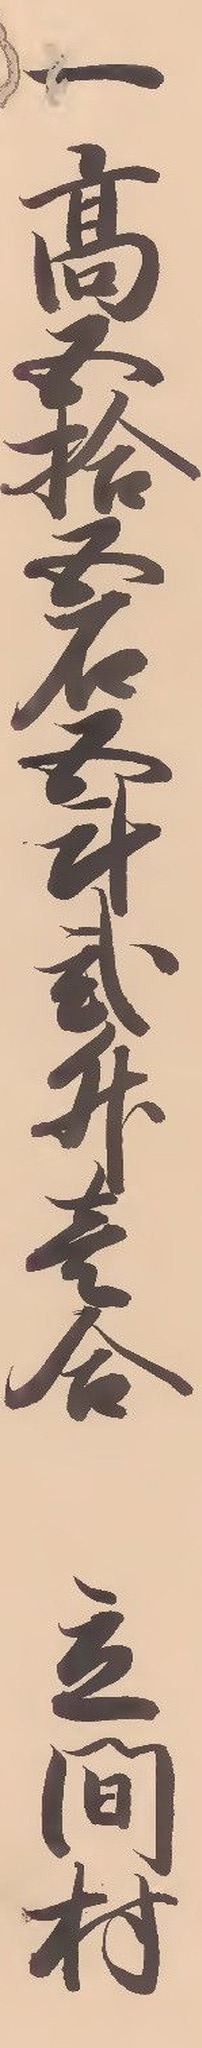一高五拾五石五斗弐升壱合立間村
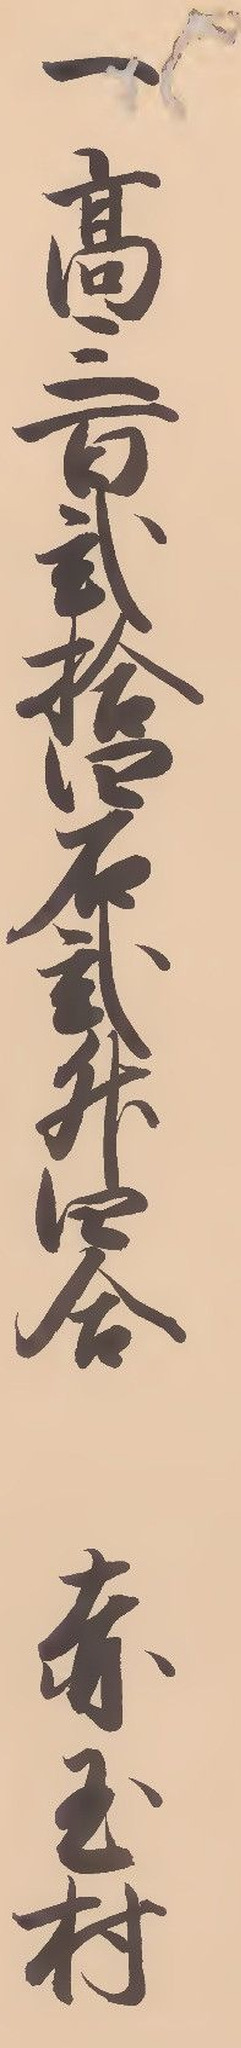一高三百弐拾四石弐升四合赤玉村
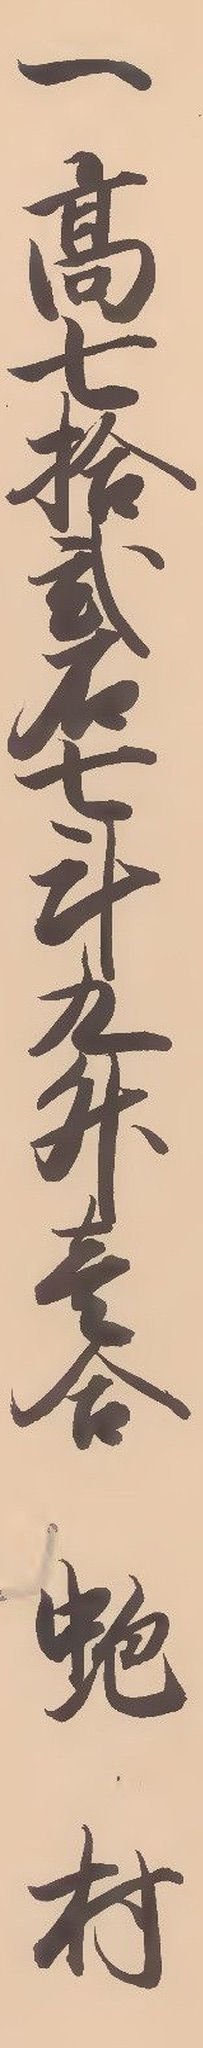一高七拾弐石七斗九升壱合蚫村
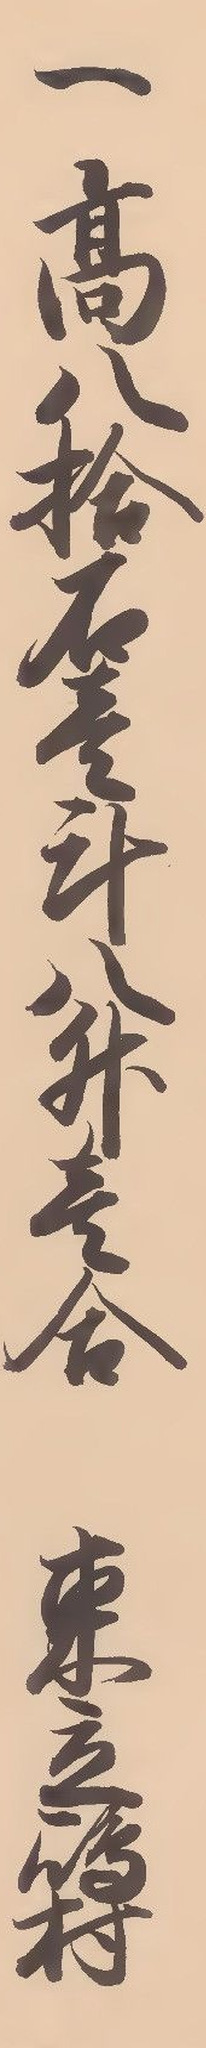一高八拾石壱斗八升壱合東立島村
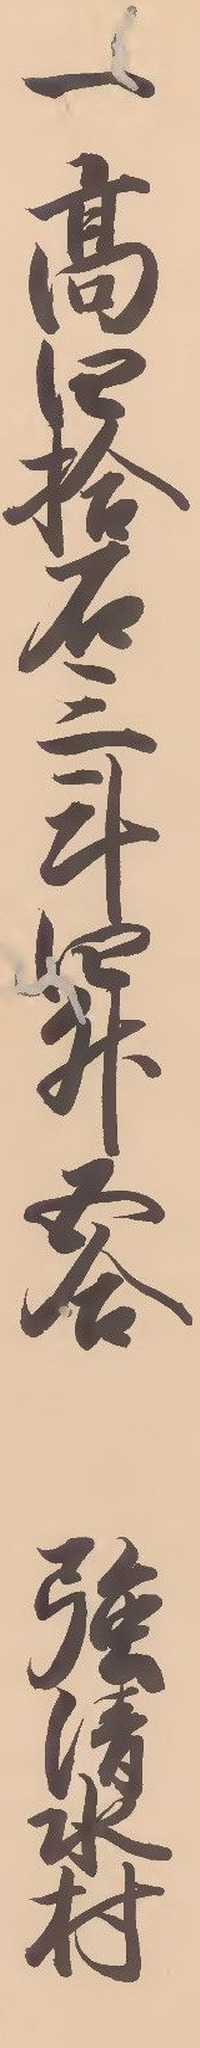一高四拾石三斗四升五合強清水村

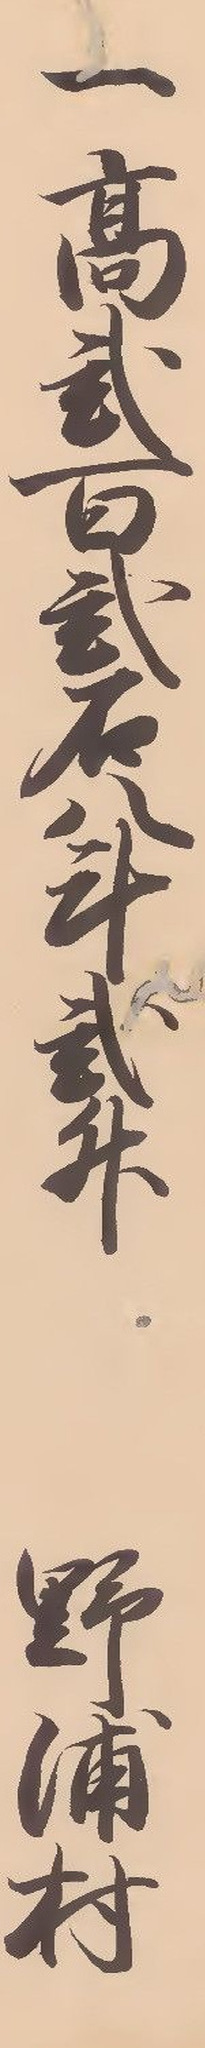一高弐百弐石八斗弐升野浦村
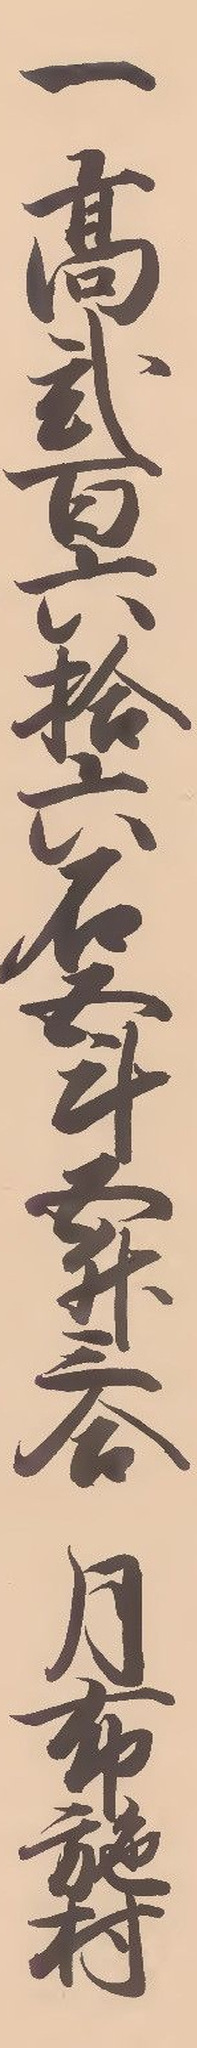一高弐百六拾六石五斗五升三合月布施村
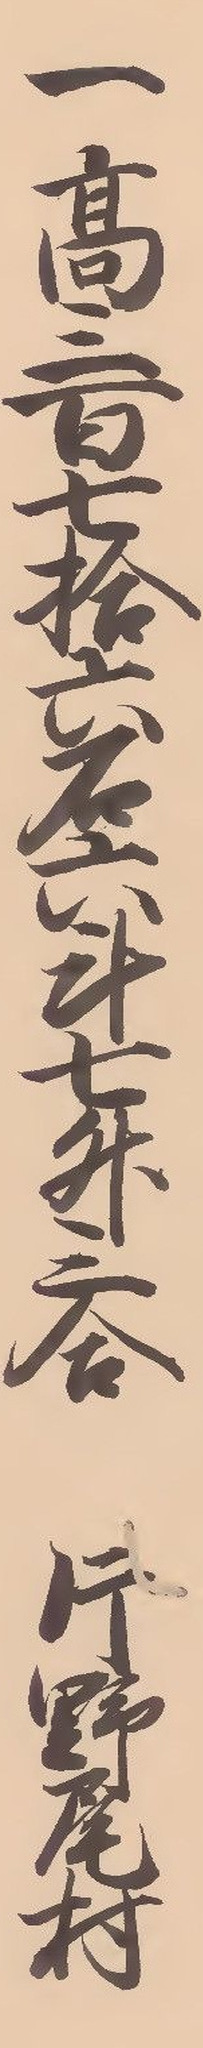一高三百七拾六石六斗七升三合片野尾村
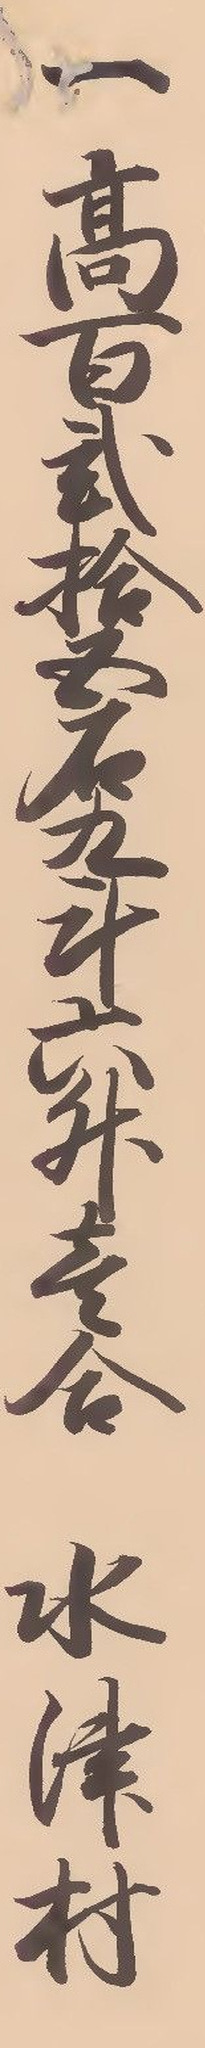一高百弐拾五石九斗六升壱合水津村
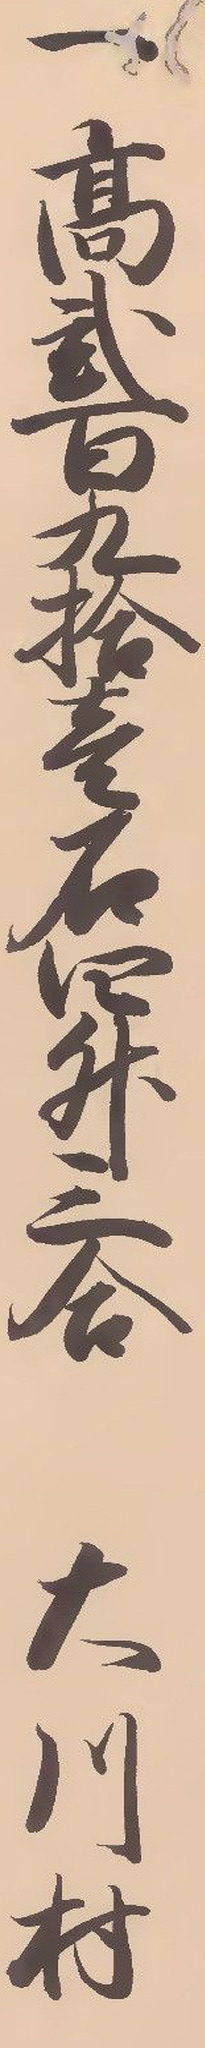一高弐百九拾壱石四升三合大川村
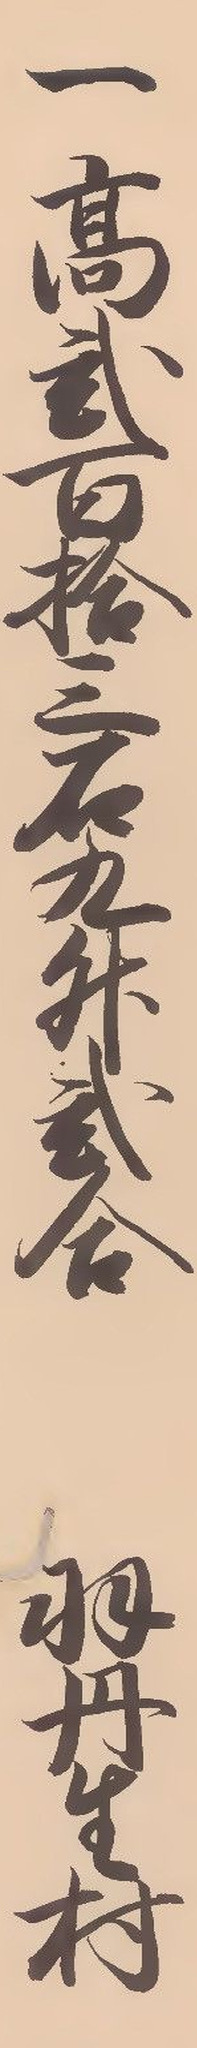一高弐百拾三石九升弐合羽丹生村
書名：佐渡国郷帳
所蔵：国立公文書館 National Archives of Japan
